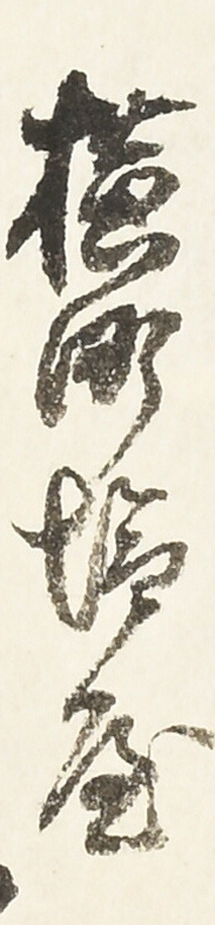横町塩屋
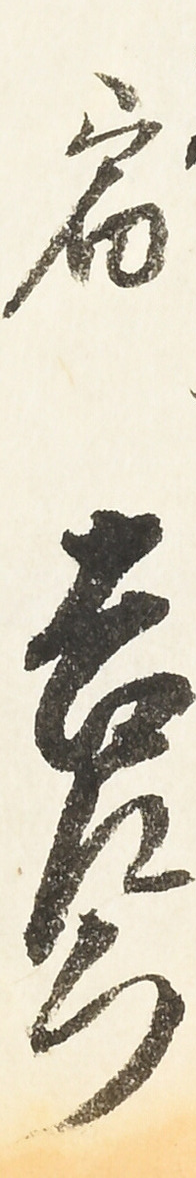宿吉左衛門
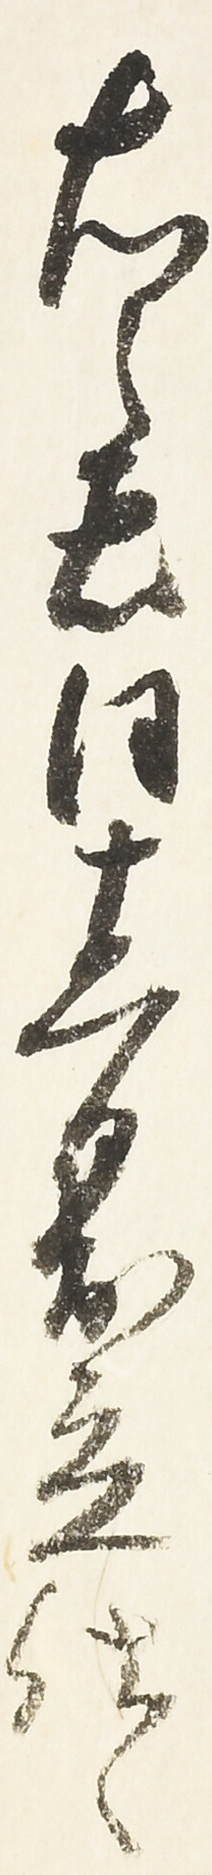右之者同十六日出立仕候
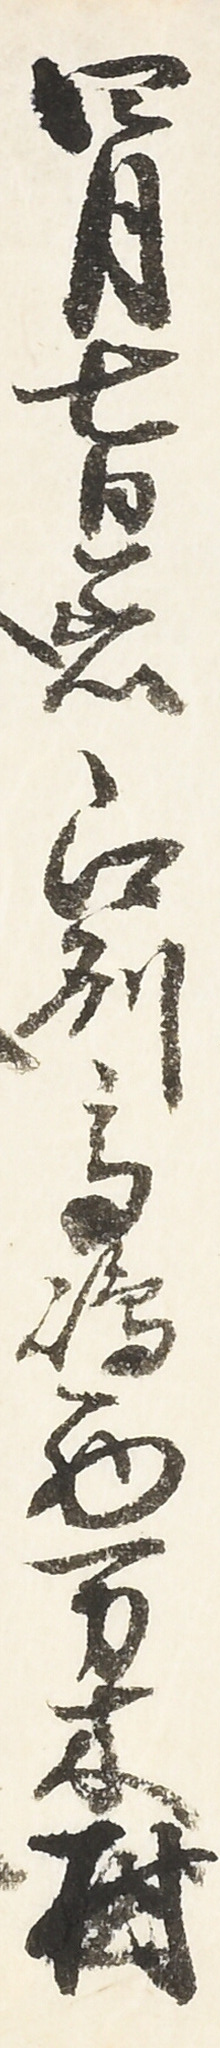四月七日着江州高嶋西万木村
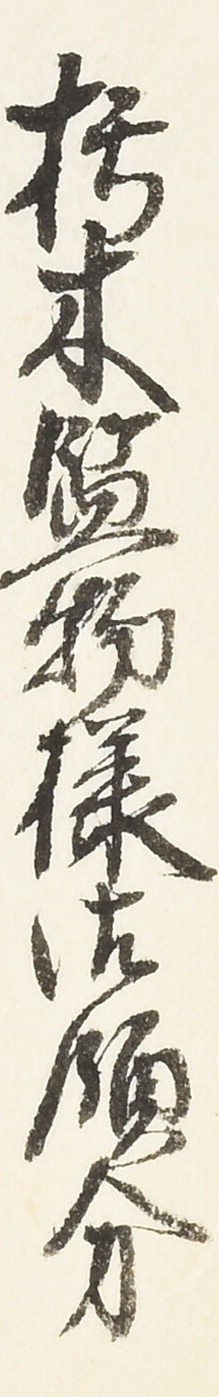朽木監物様御領分
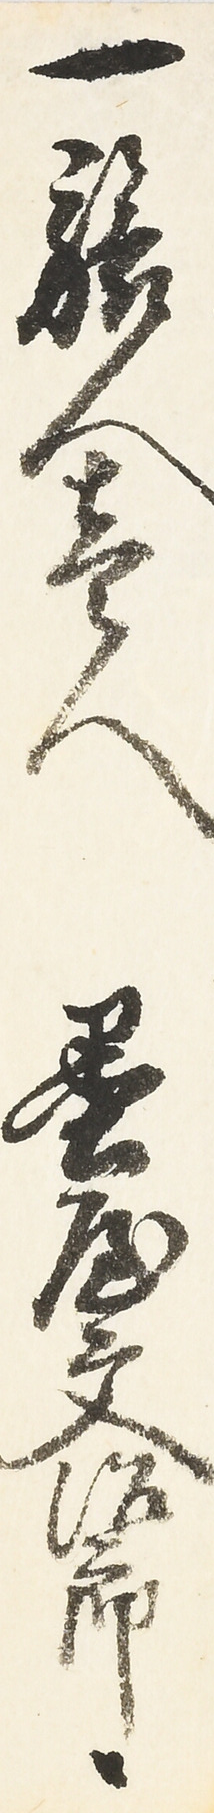一旅人壱人墨屋文治郎・
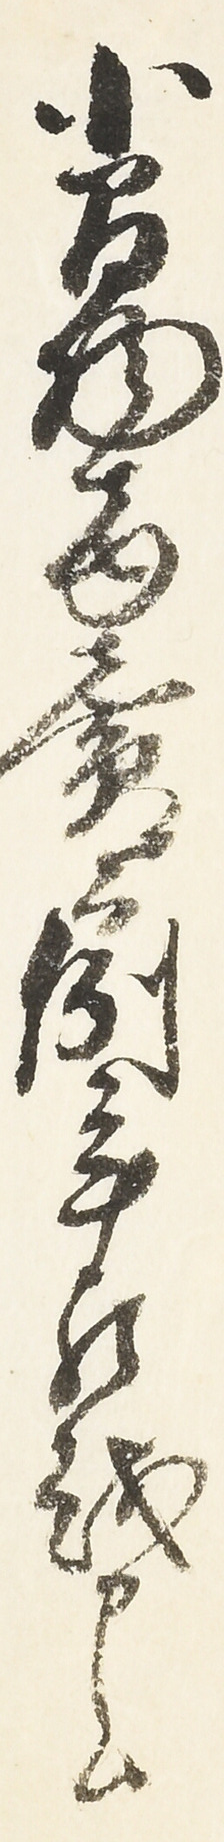小間物商売ニ而例年罷越申候
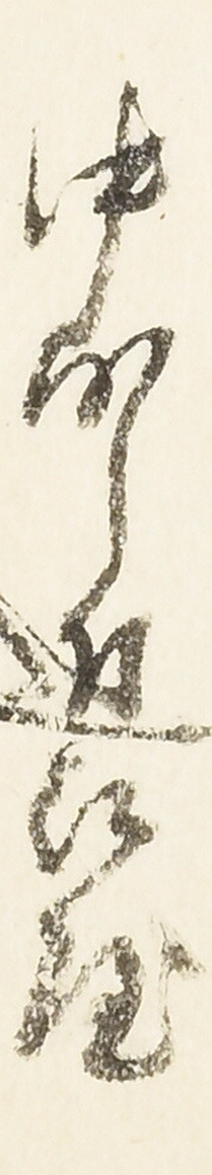中町近江屋
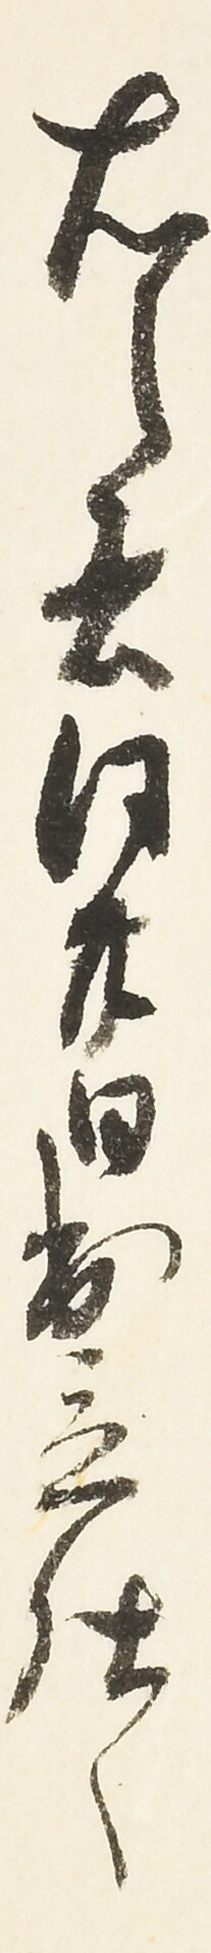右之者同廿日出立仕候
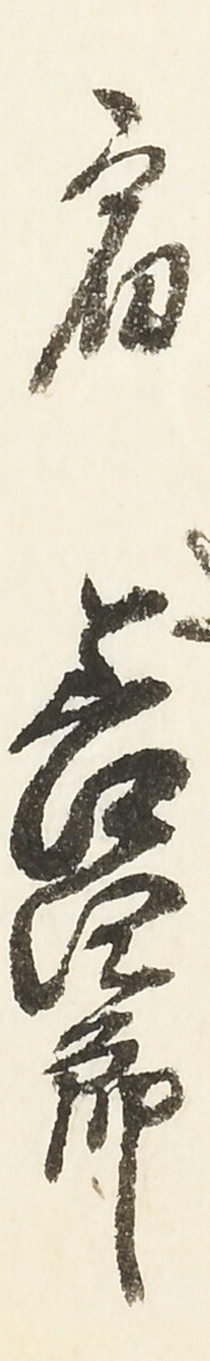宿善四郎
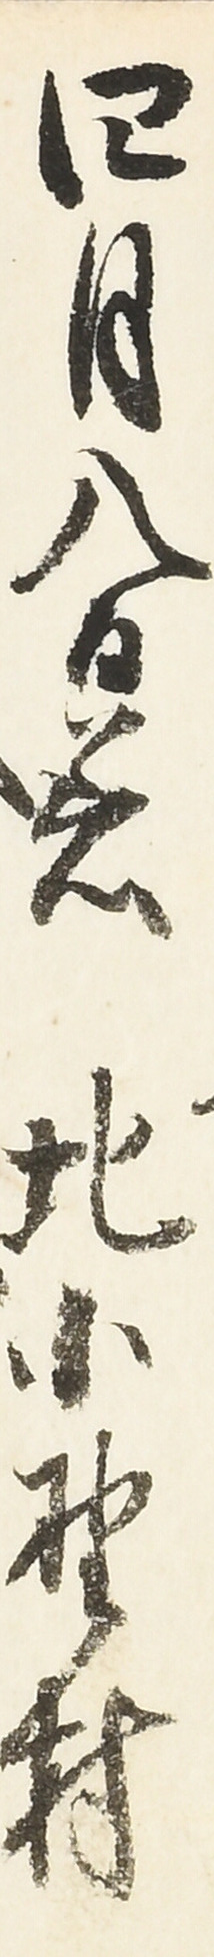四月八日着北小野村
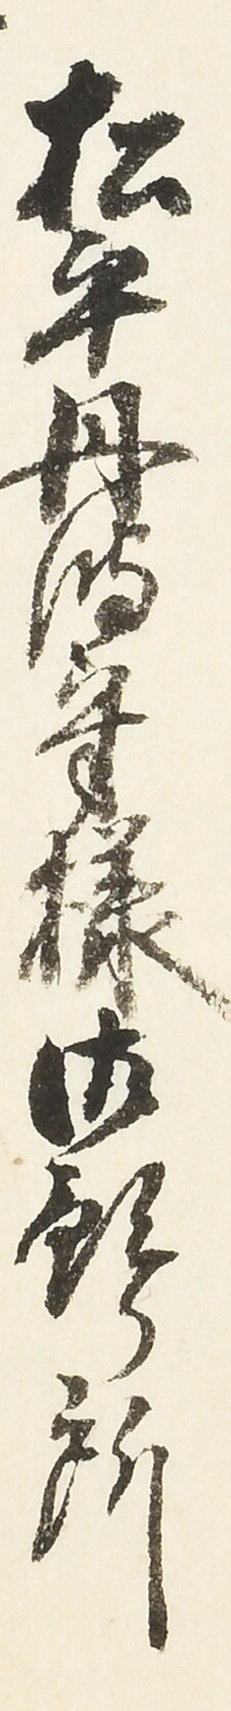松平丹波守様御預リ所
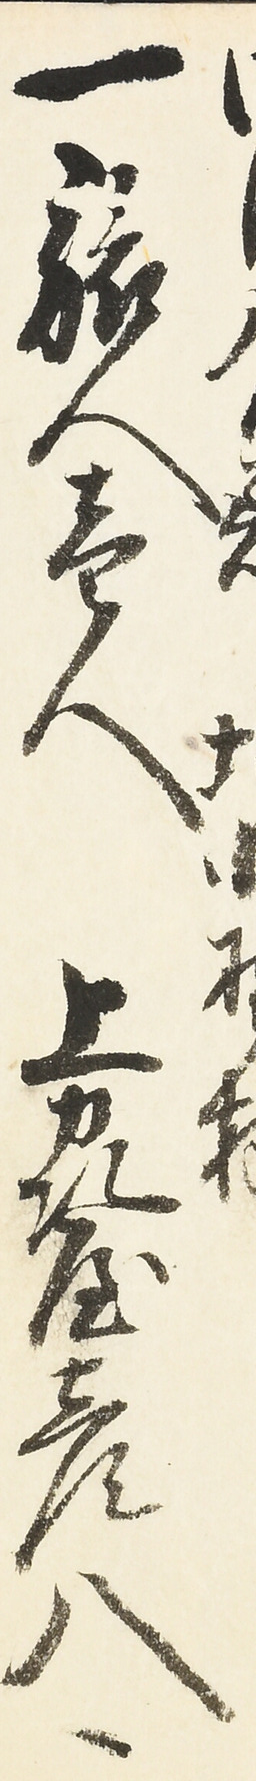一旅人壱人上州屋彦八・
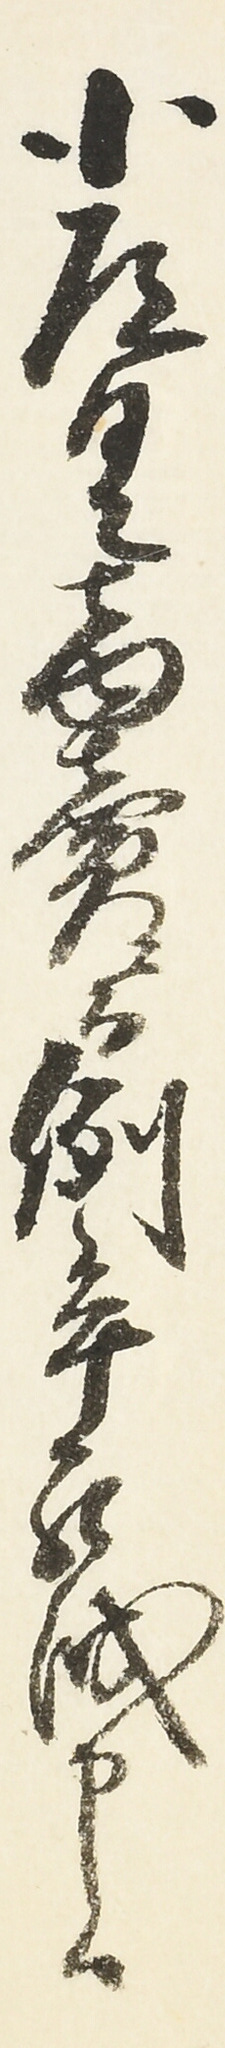小道具商売ニ而例年罷越申候
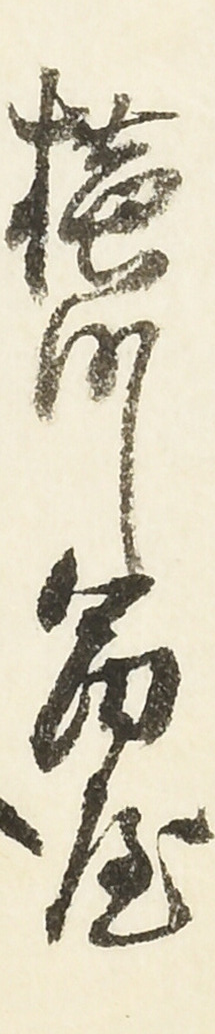横町塩屋
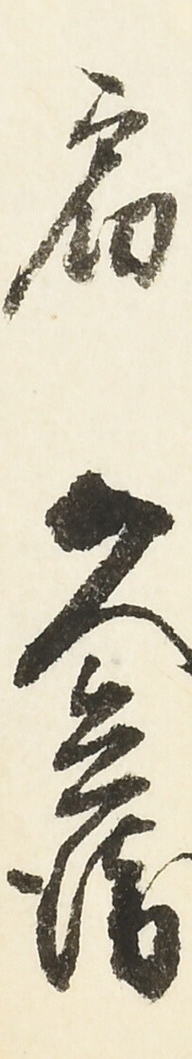宿久兵衛
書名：町中旅人泊控帳
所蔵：伊那市立高遠町図書館・合同会社AMANE
